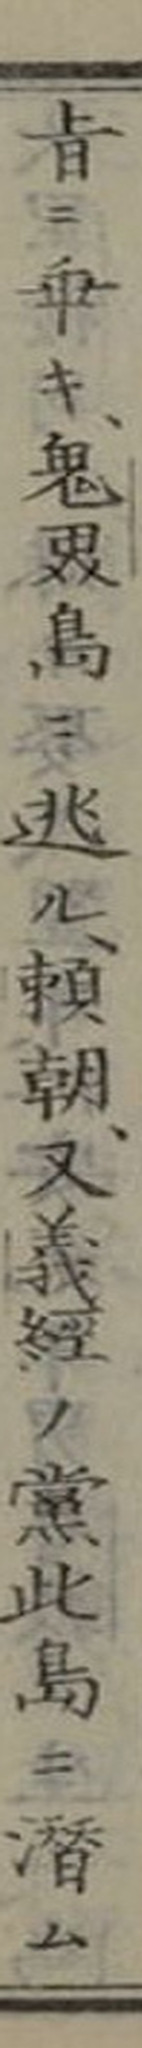旨ニ乖キ、鬼界島ニ逃ル、頼朝、又義経ノ党此島ニ潜ム
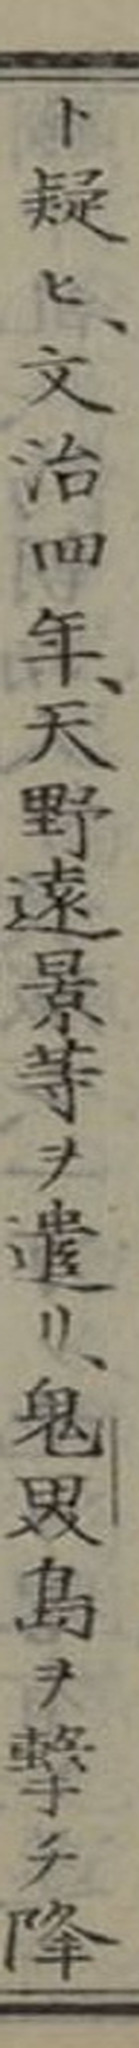ト疑ヒ、文治四年、天野遠景ヲ遣リ、鬼界島ヲ撃チ降
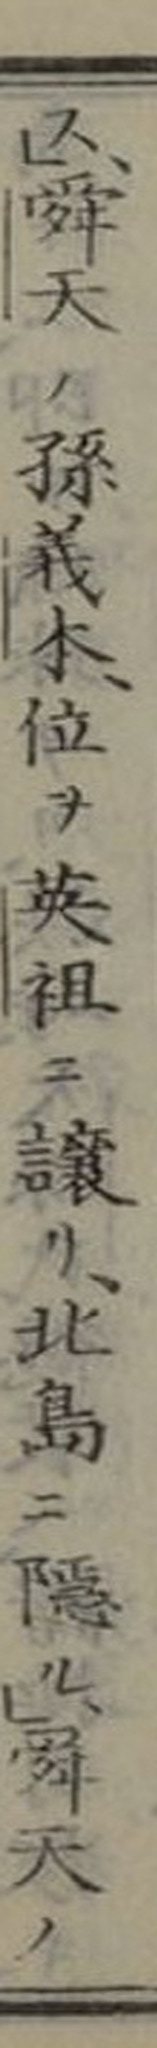ス、」舜天ノ孫義本、位ヲ英祖ニ譲リ、北島ニ隠ル、」天ノ
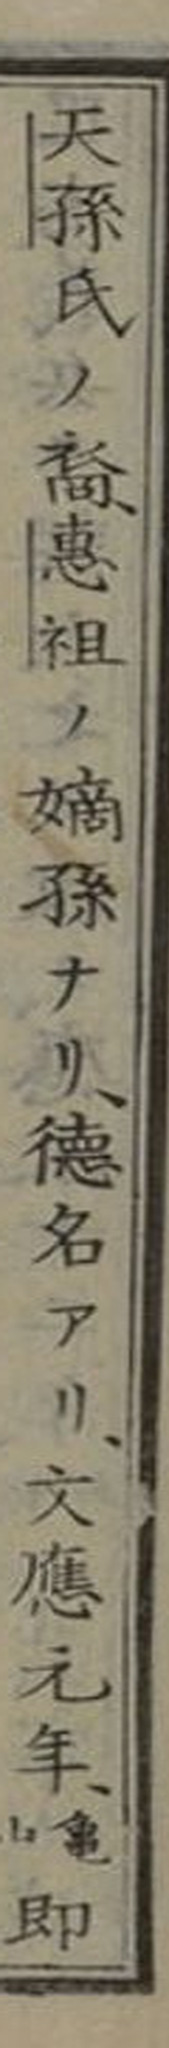天孫氏ノ裔、恵祖ノ嫡孫ナリ、徳名アリ、文応元年、亀山即
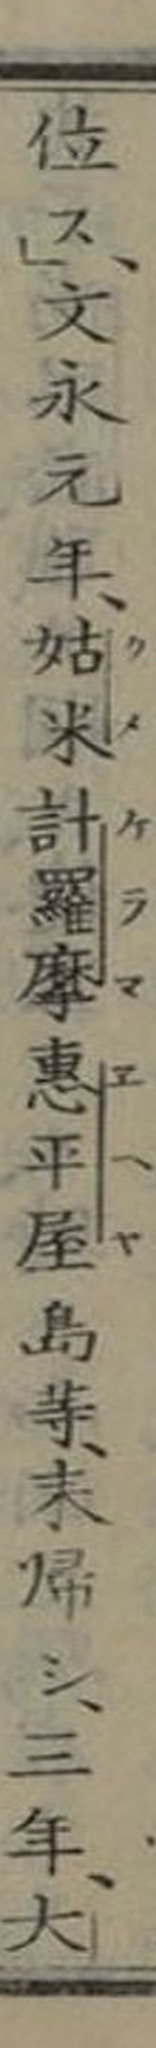位ス、」文永元年、姑米計羅摩恵平屋島等、来帰シ、三年、大
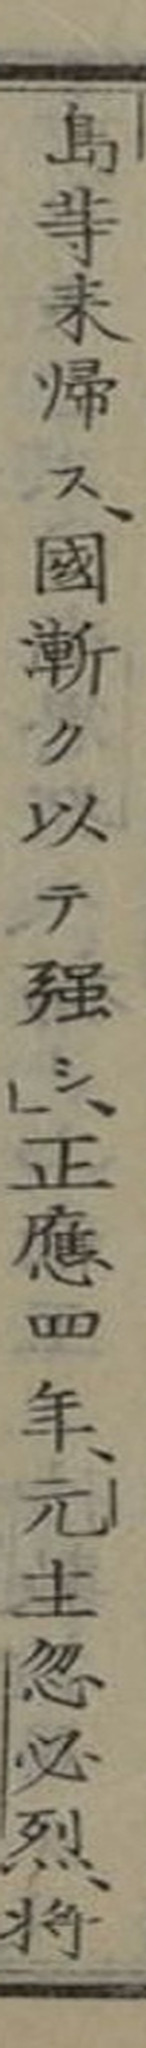島等来帰ス、国漸ク以テ強シ、」正応四年、元主忽必烈、将
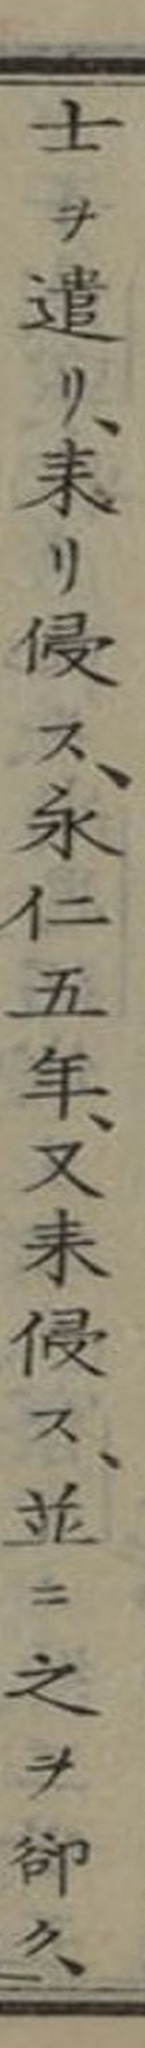士ヲ遣リ、来リ侵ス、永仁五年、又来侵ス、並ニ之ヲ却ク、」
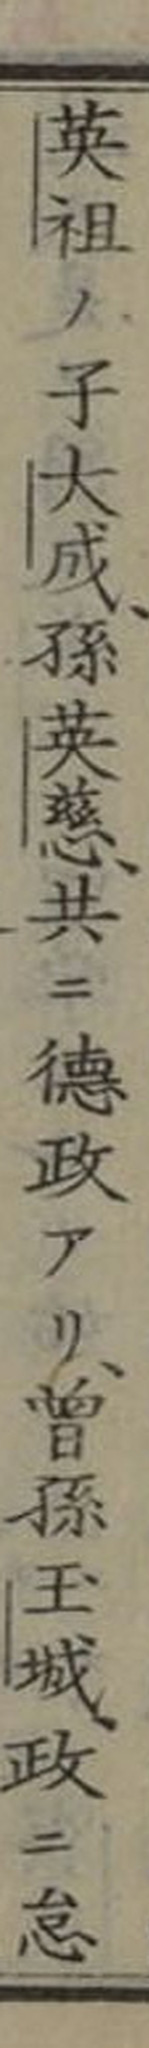英祖ノ子大成、孫英慈、共ニ徳政アリ、曾孫玉城、政ニ怠
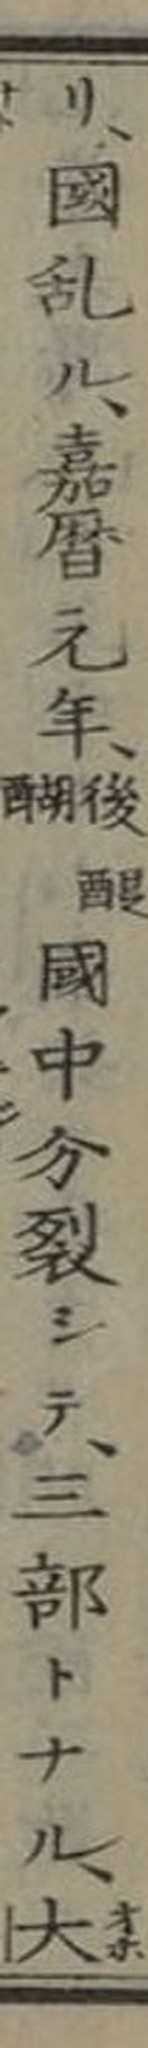リ、国乱ル、嘉暦元年、後醍醐国中分裂シテ、三部トナル、大
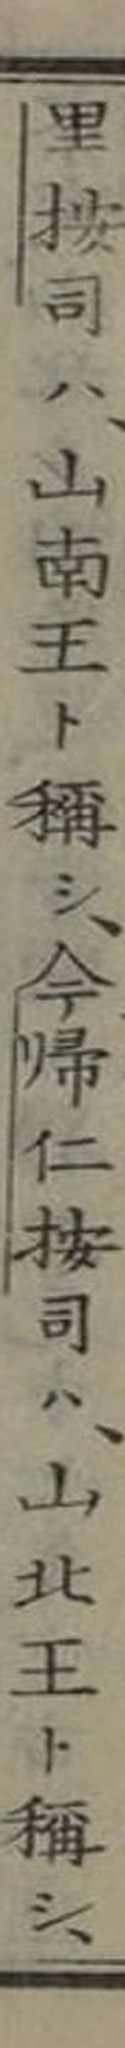里按司ハ、山南王ト称シ、今帰仁按司ハ、山北王ト称シ、
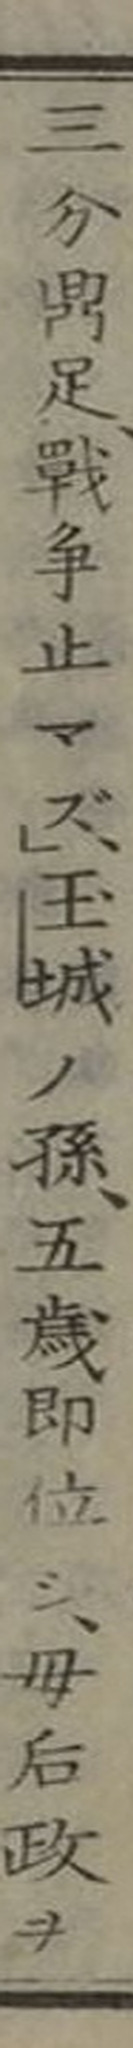三分鼎足、戦争止マズ、」玉城ノ孫、五歳即位シ、母后政ヲ
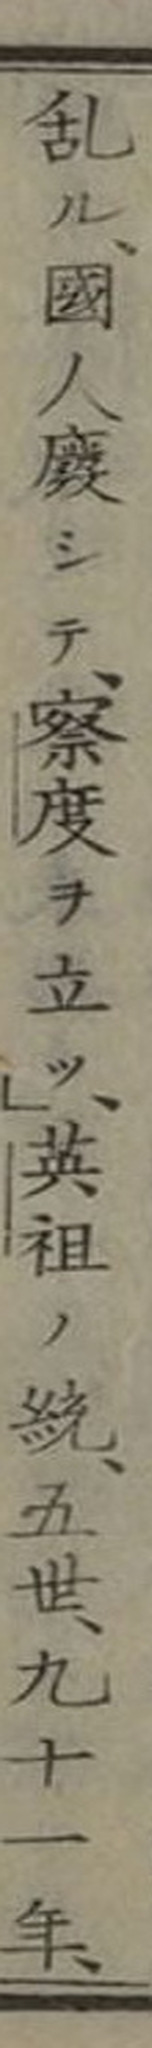乱ル、国人廃シテ、察度ヲ立ツ、」英祖ノ統、五世、九十一年、
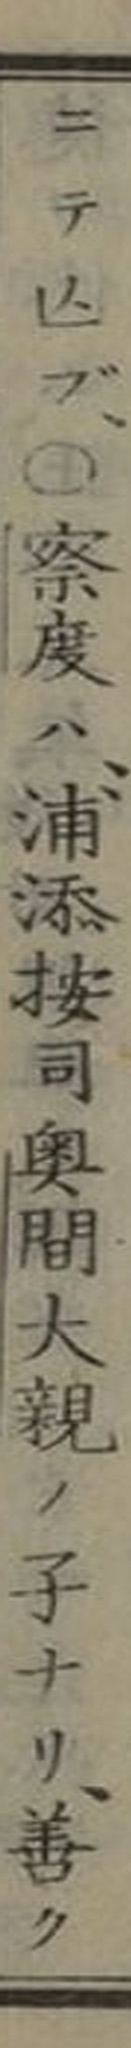ニテ亡ブ、○察度ハ、浦添按司奥間大親ノ子ナリ、善ク

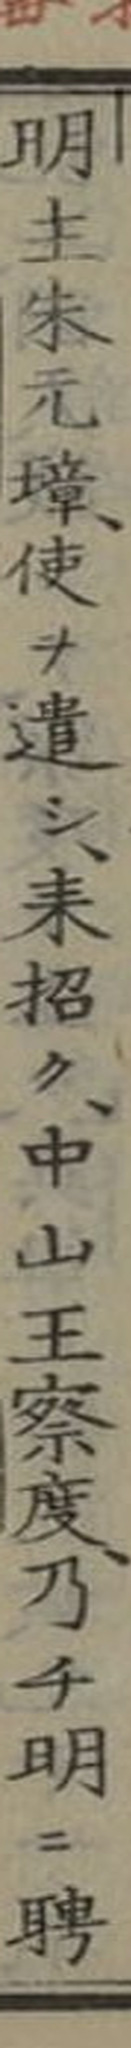明主朱元璋、使ヲ遣シ、来招ク、中山王察度、乃チ明ニ聘
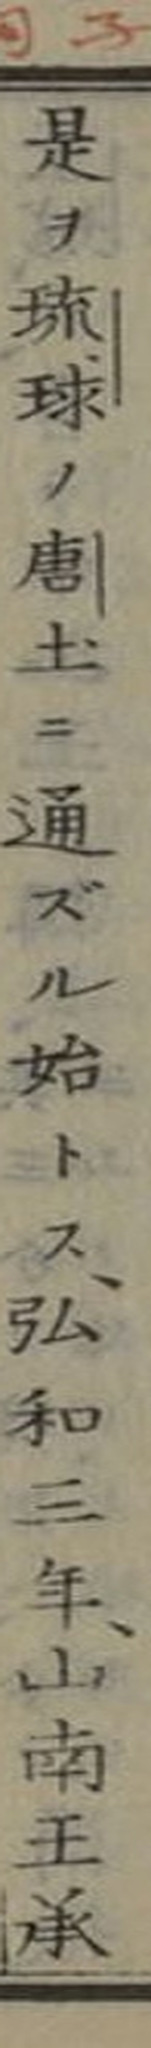是ヲ琉球ノ唐土二通ズル始トス、弘和三年、山南王承
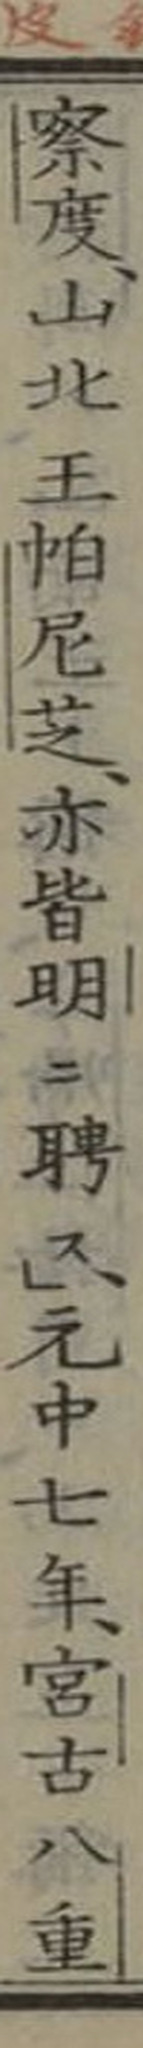察度、山北王帕尼芝、亦皆明ニ聘ス、」元中七年、宮古八重
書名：琉球新誌 図附 上
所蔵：University of the Ryukyus Library
